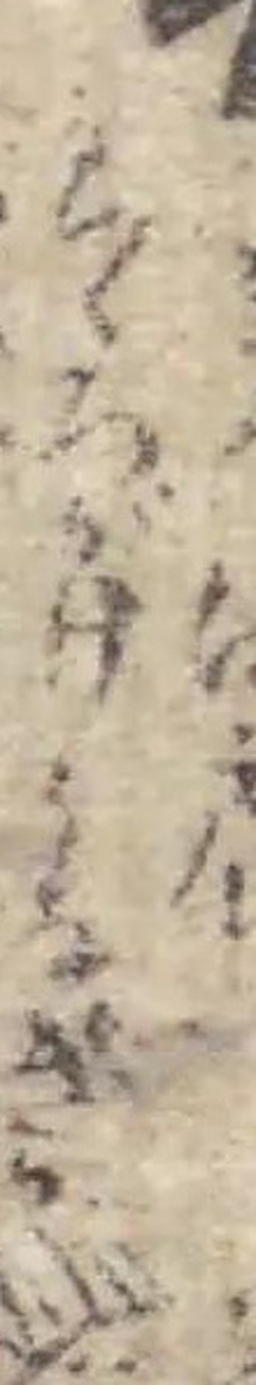こゝろがけうなぎか
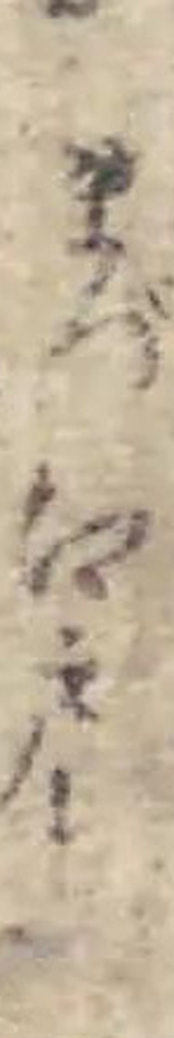まづ江戸
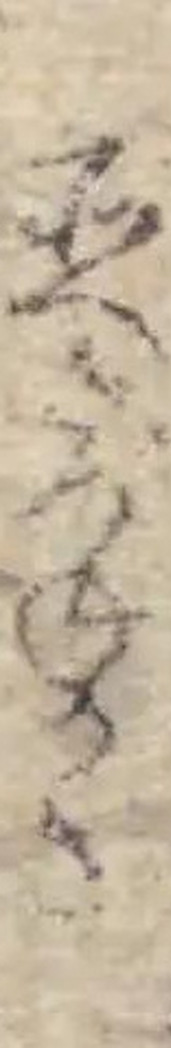所へたつねつき
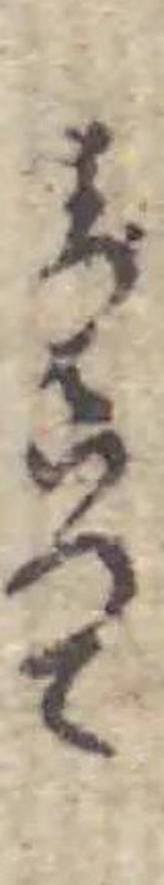まづはいつて
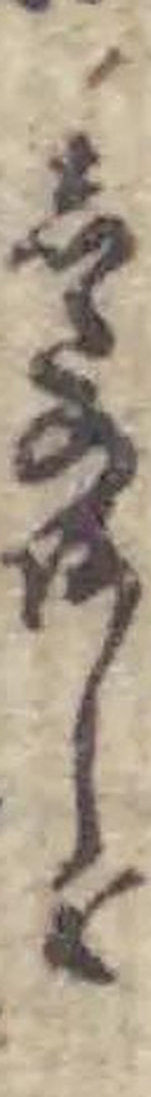したのあしを
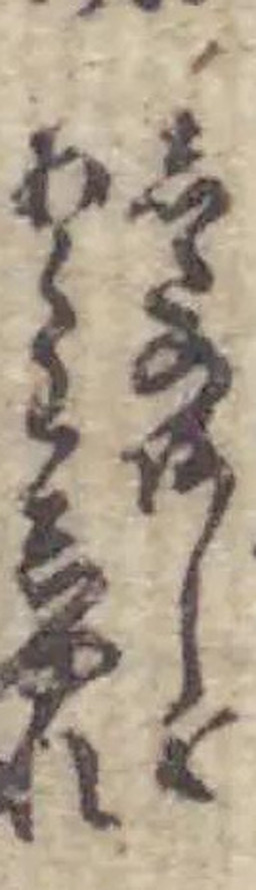あらわしやれ
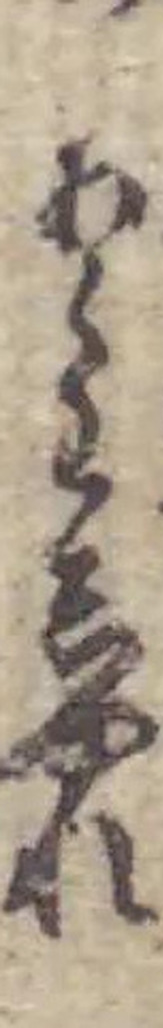あらわしやれ
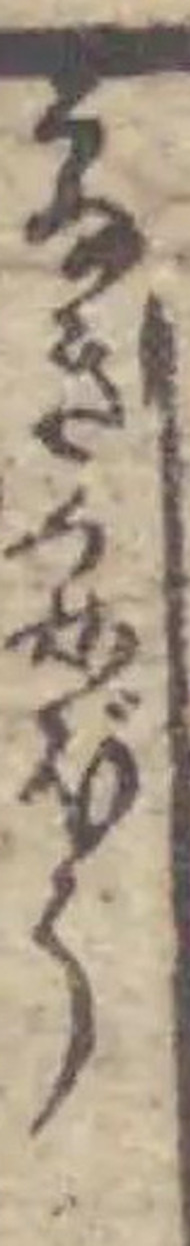うなきが女ぼう

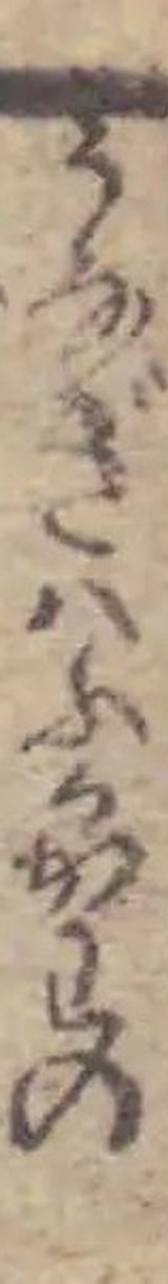うなぎはふかかわの
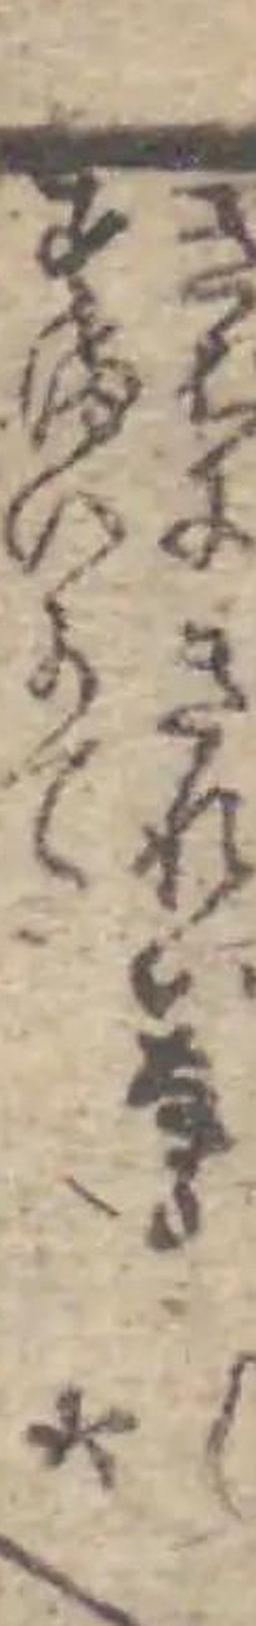すまいにて
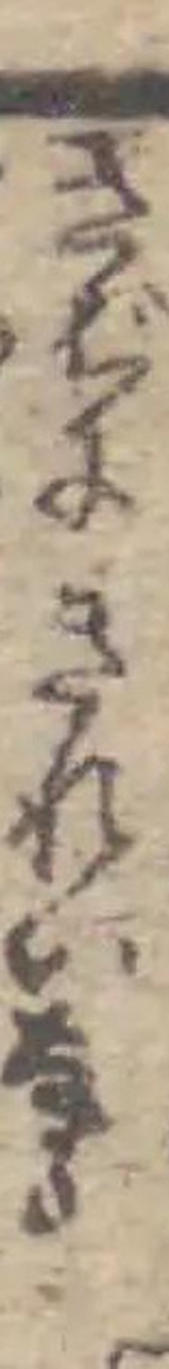きばにきれいなる
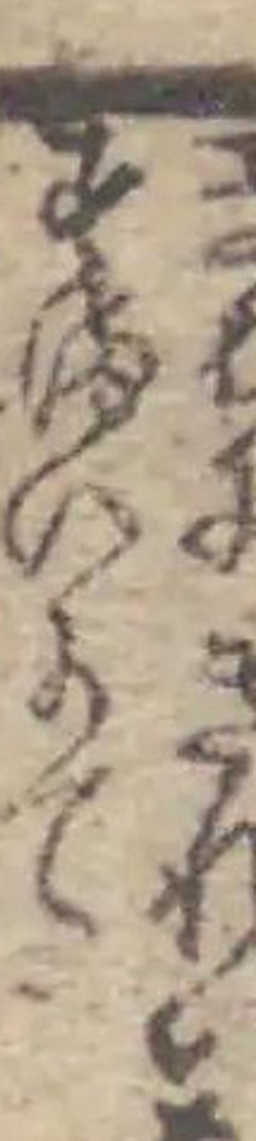すまいにて
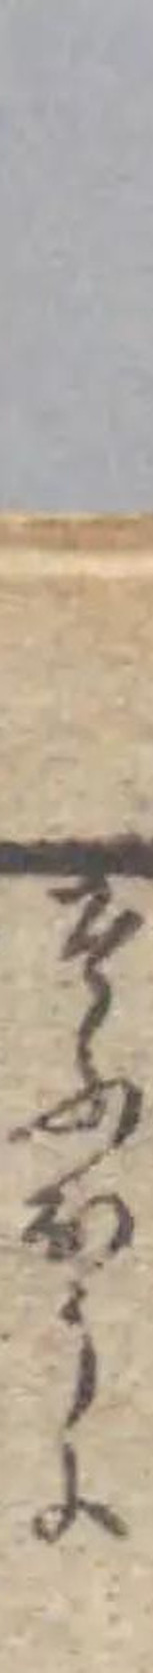そふおうに
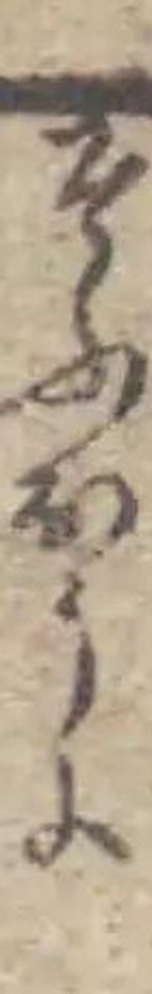そふおうに
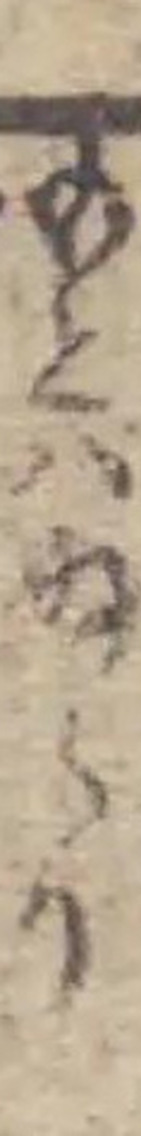もとはぬらり
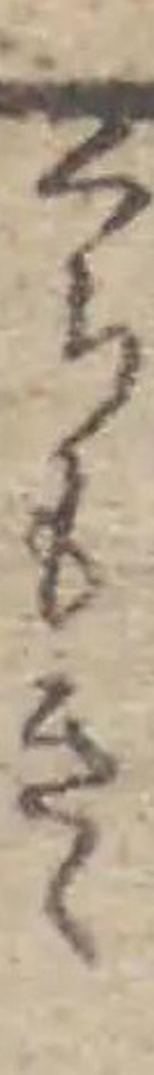くちもきく
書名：蟹牛房挟多 3巻
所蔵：国立国会図書館 National Diet Library, JAPAN
